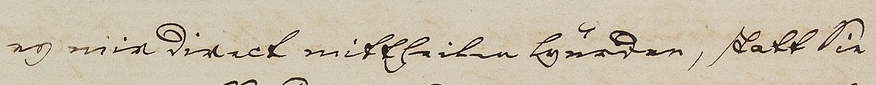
es mir direct mittheilen würden, statt Sie
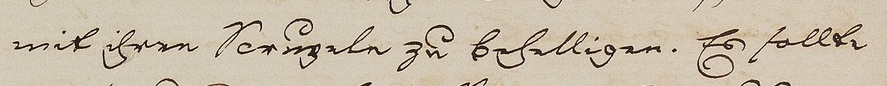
mit ihren Scrupeln zu behelligen. Es sollte
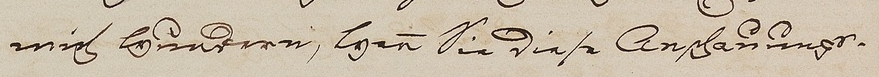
mich wundern, wenn Sie diese Anschauungs-
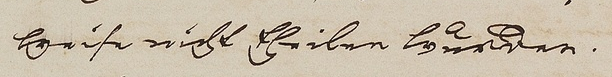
weise nicht theilen würden.
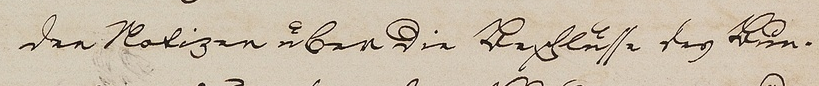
Den Notizen über die Beschlüsse des Bun-
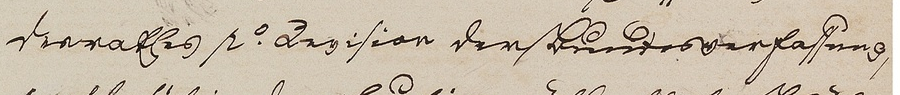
desrathes po Revision der Bundesverfassung,
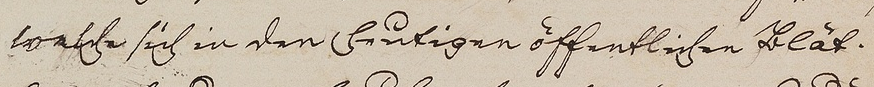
welche sich in den heutigen öffentlichen Blät-
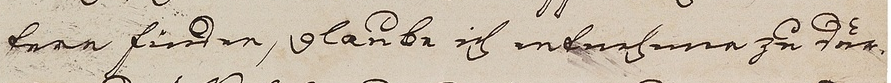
tern finden, glaube ich entnehmen zu dür-
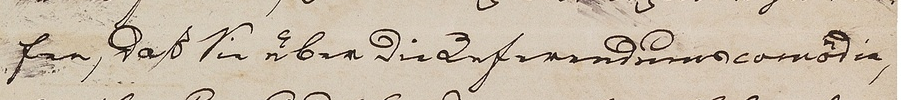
fen, daß Sie über die Referendumscomödie,
